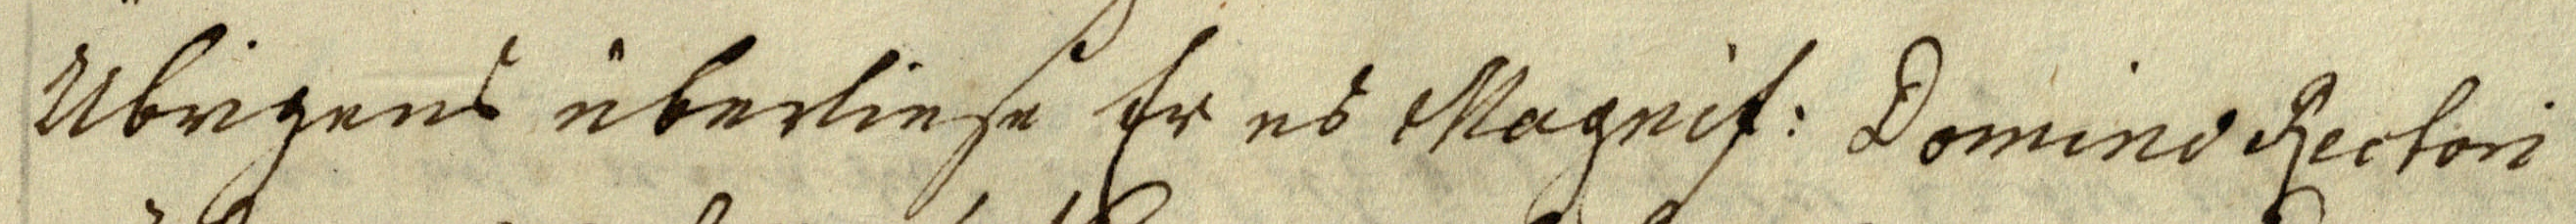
Übrigens überließe Er es Magnif: Domino Rector
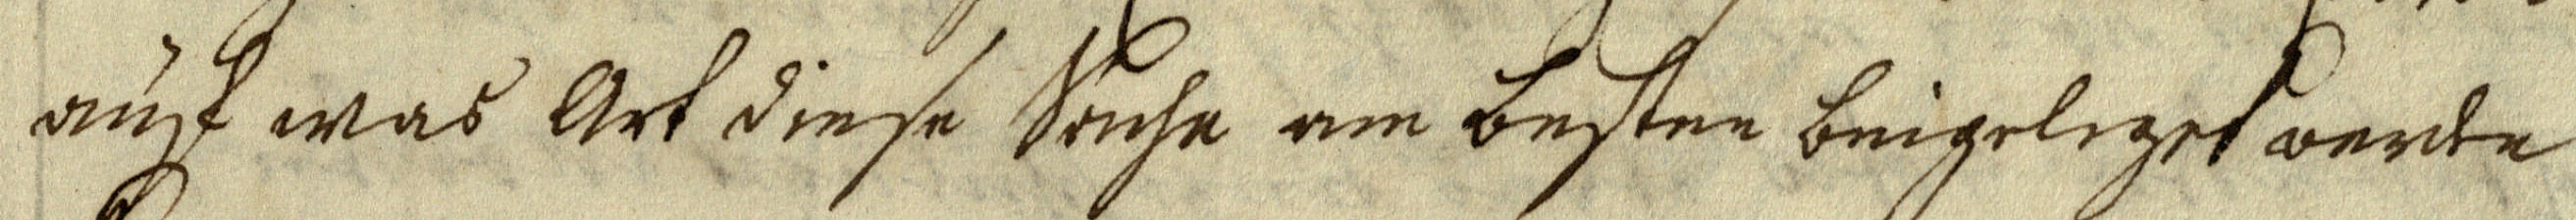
auf was Art diese Sache am besten beigeleget werden
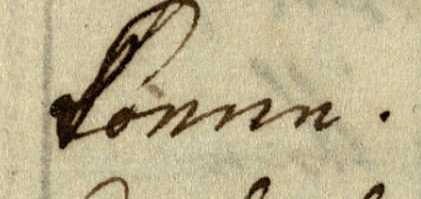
könne.
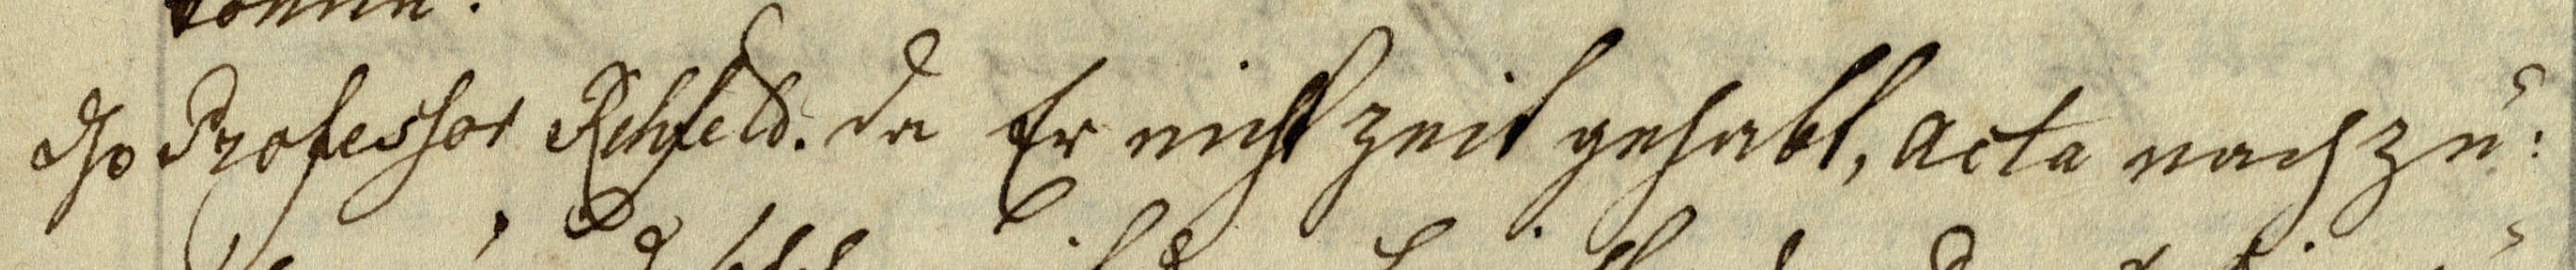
dh Professor Rehfeld. da Er nicht zeit gehabt, acta nachzu¬
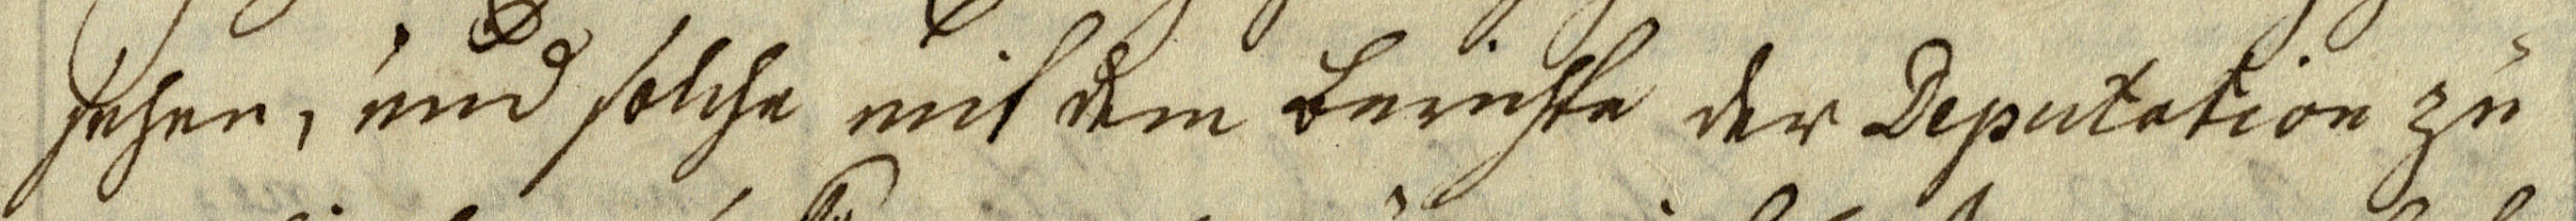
sehen, und solche mit dem Berichte der Deputation zu
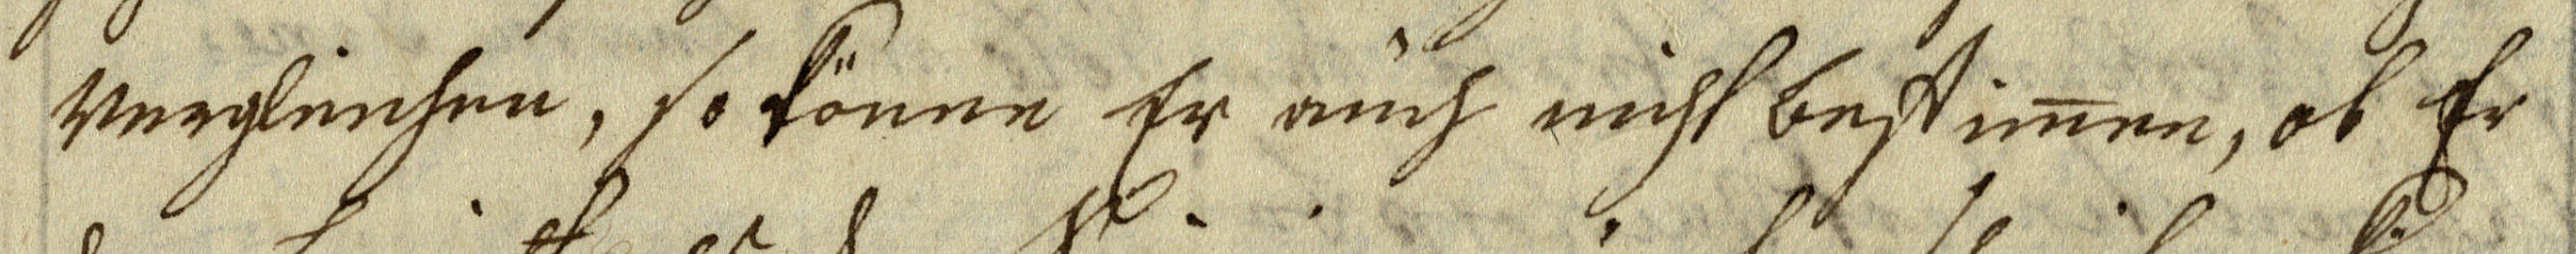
vergleichen, so könne Er auch nicht bestimen, ob Er
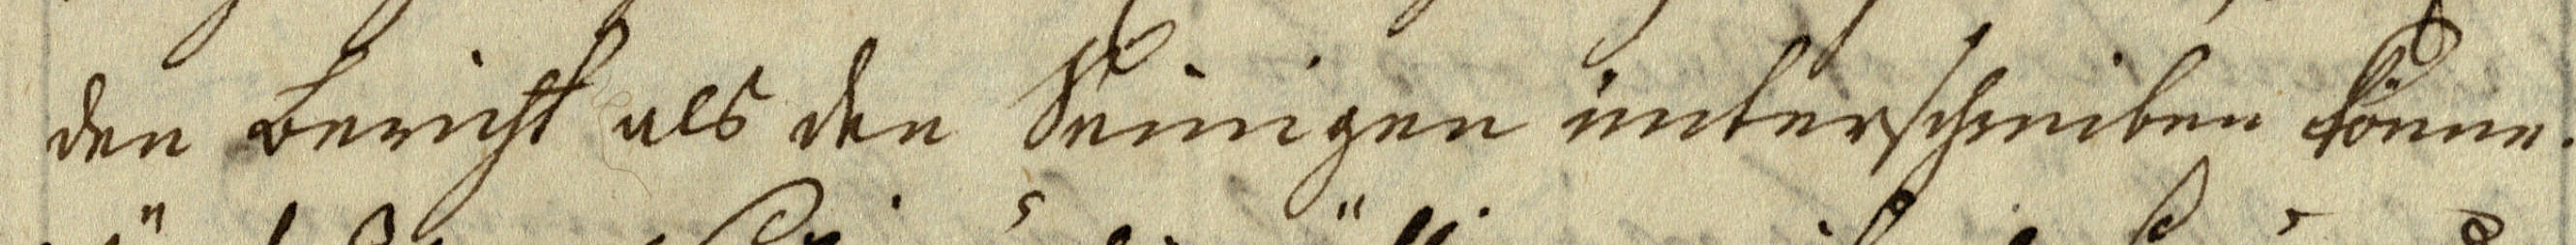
den Bericht als den Seinigen unterschreiben könne.
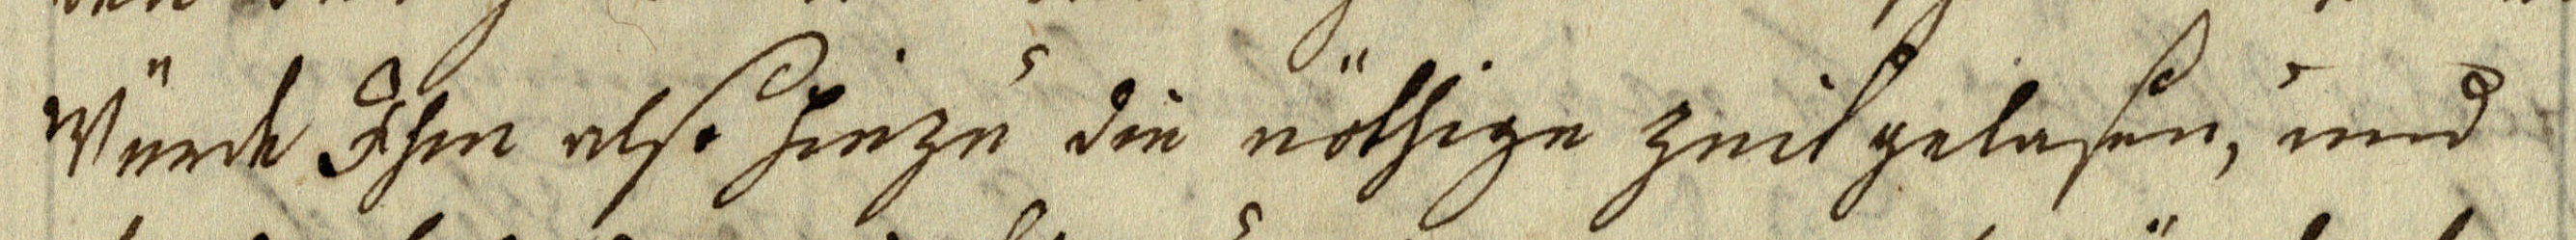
Würde Ihm also hiezu die nöthige Zeit gelaßen, und
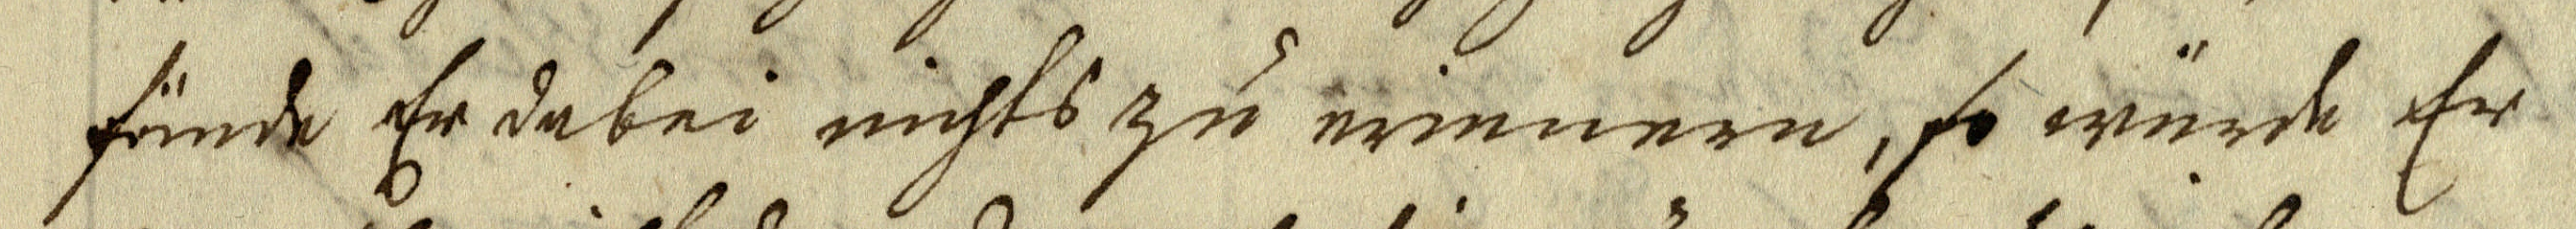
fände Er dabei nichts zu erinnern, so würde Er
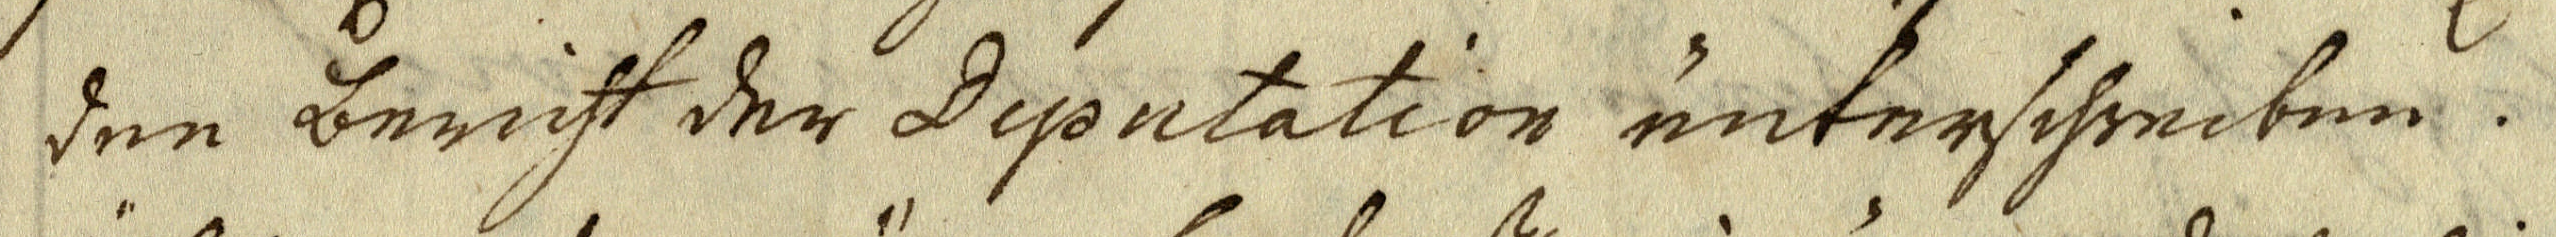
den Bericht der Deputation unterschreiben.
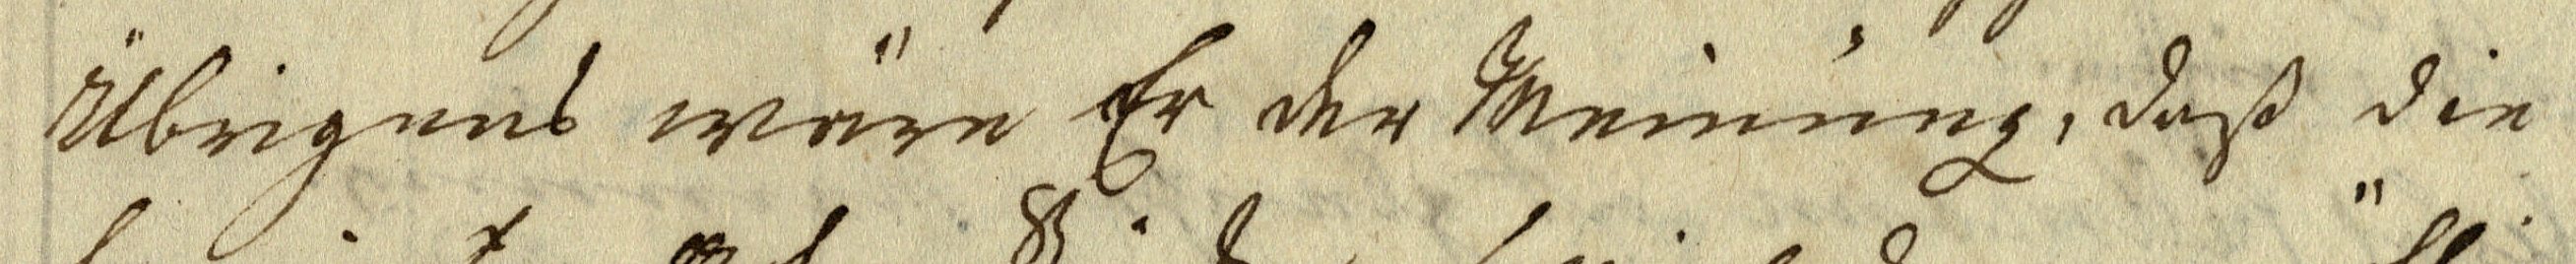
Übrigens wäre Er der Meinung, daß die
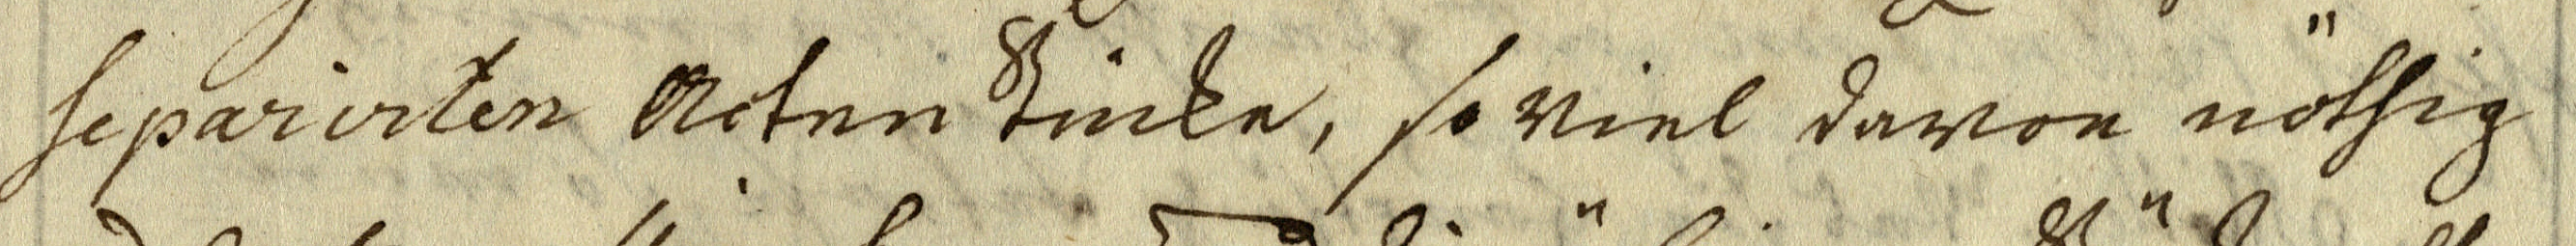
separirten Acten Stücke, so viel davon nöthig
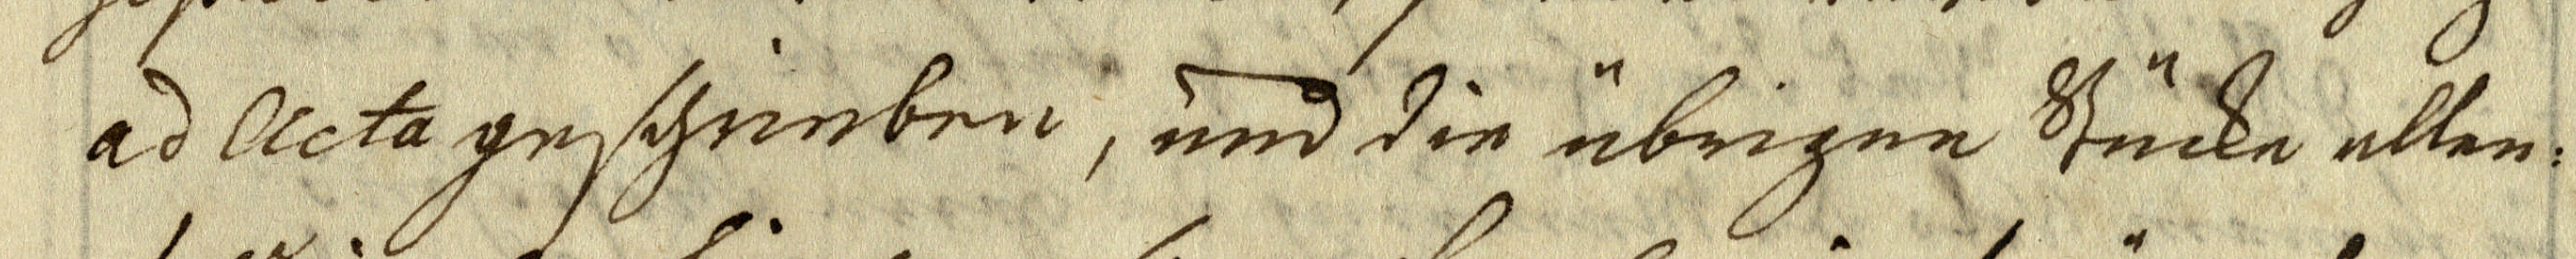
ad Acta geschrieben, und die übrigen Stücke allen¬
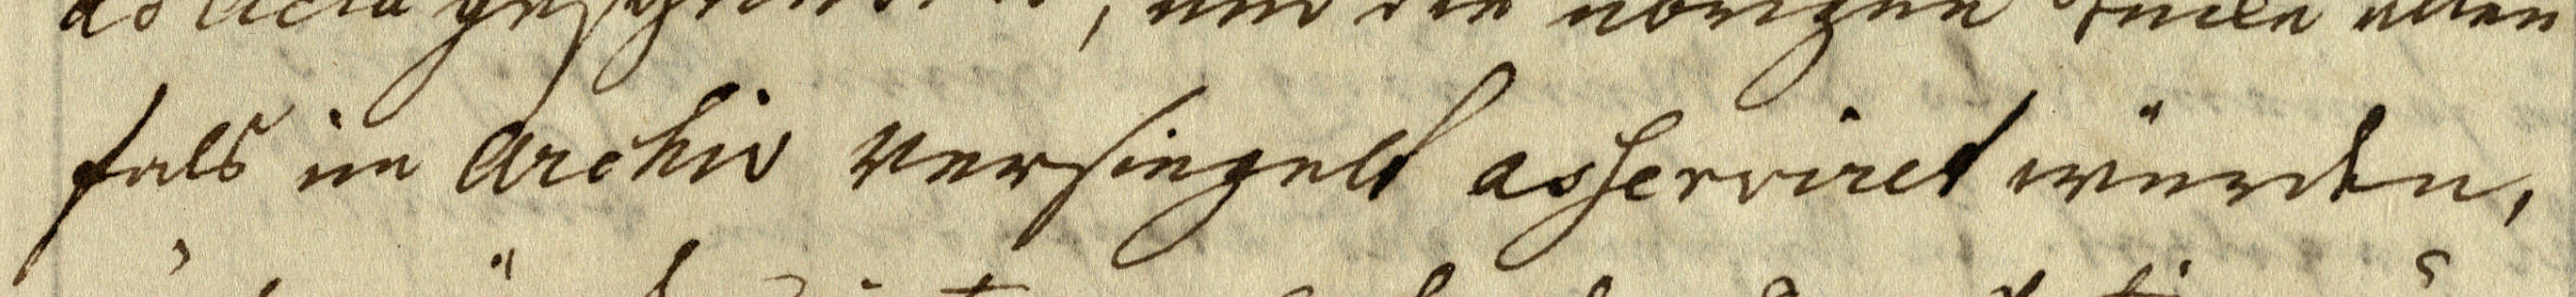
fals im Archiv versiegelt asserviret würden,
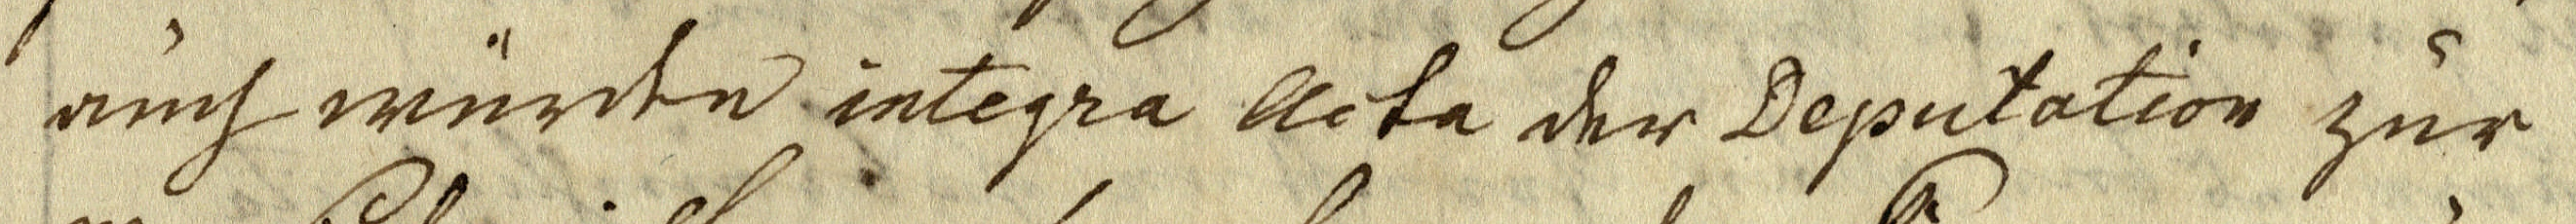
auch würden integra Acta der Deputation zur
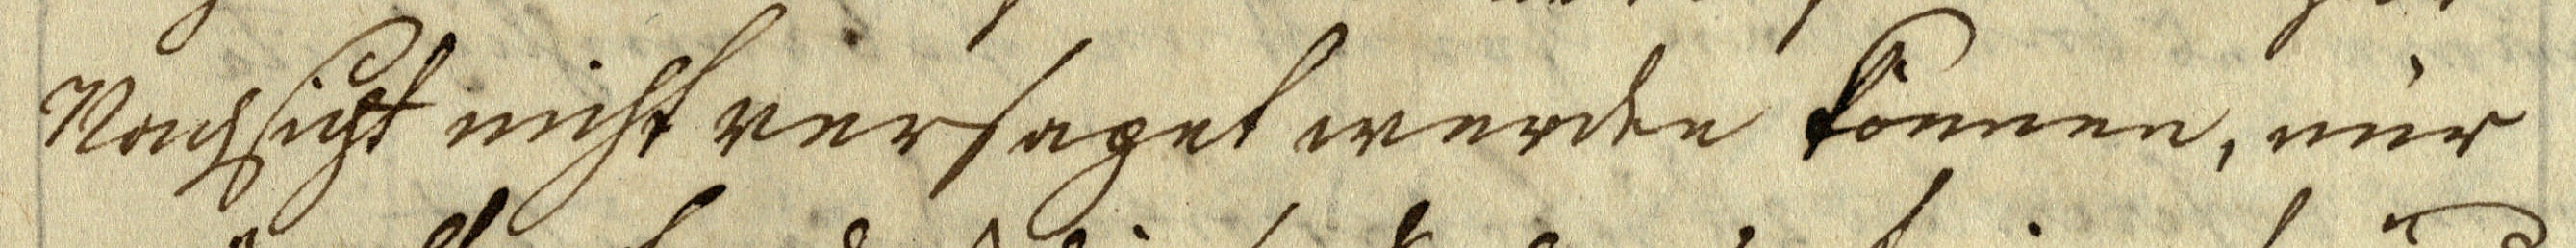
Nachsicht nicht versaget werden können, nur
